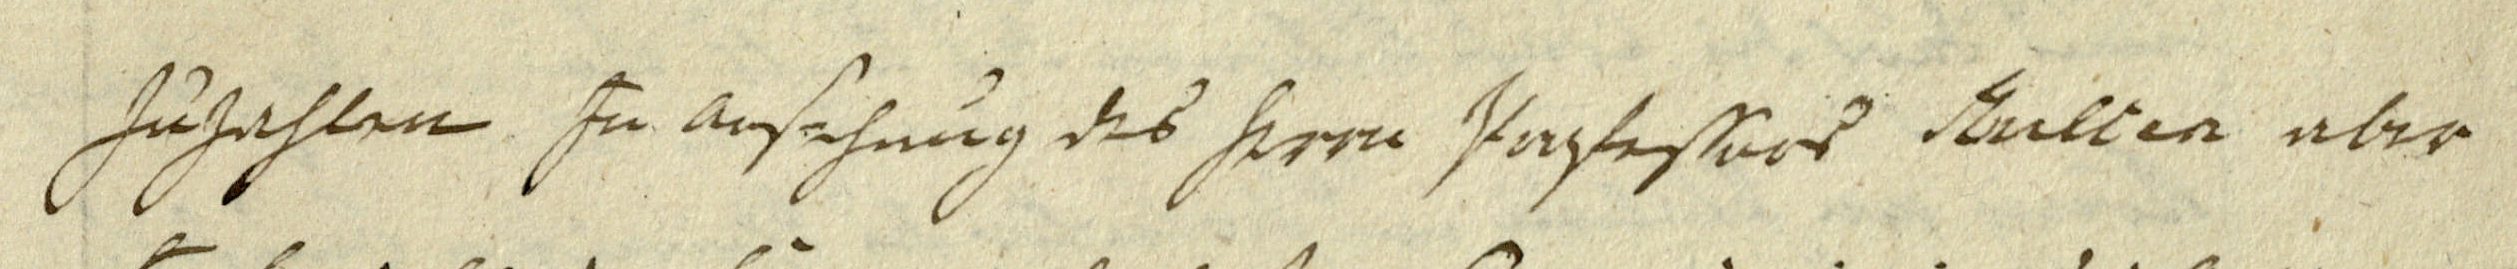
zuzahlen. In Ansehung des Herrn Professors Hulten aber
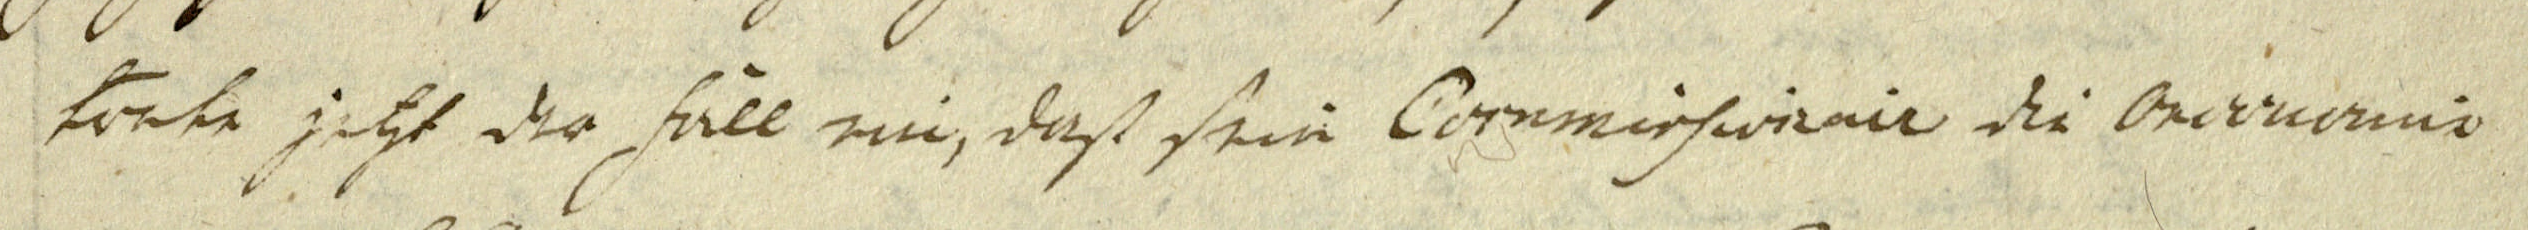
trete jetzt der Fall ein, daß sein Commissionair die Oeconomie
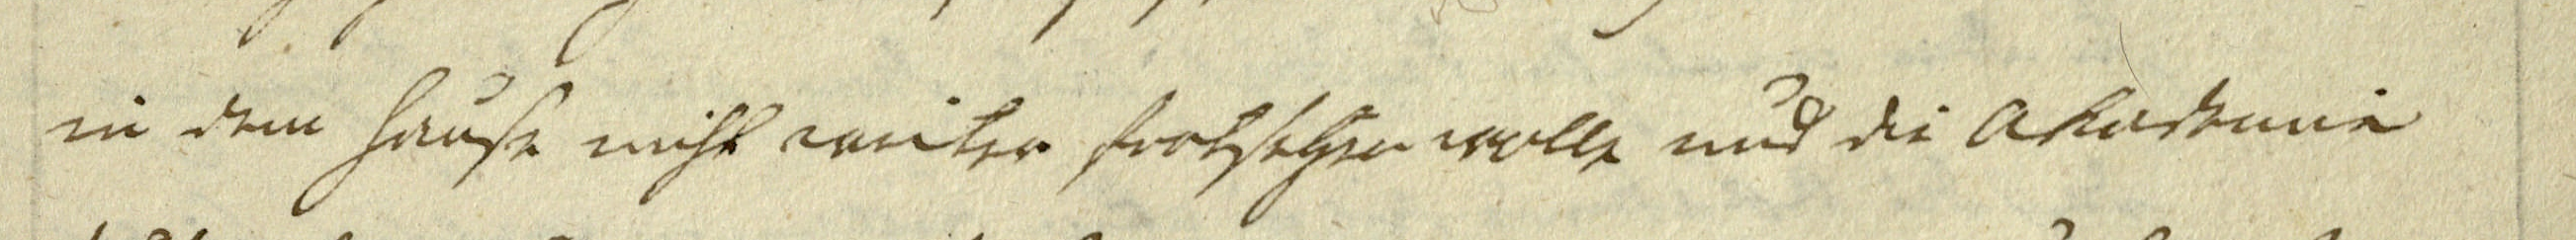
in dem Hause nicht weiter fortsetzen wolle und die Akademie
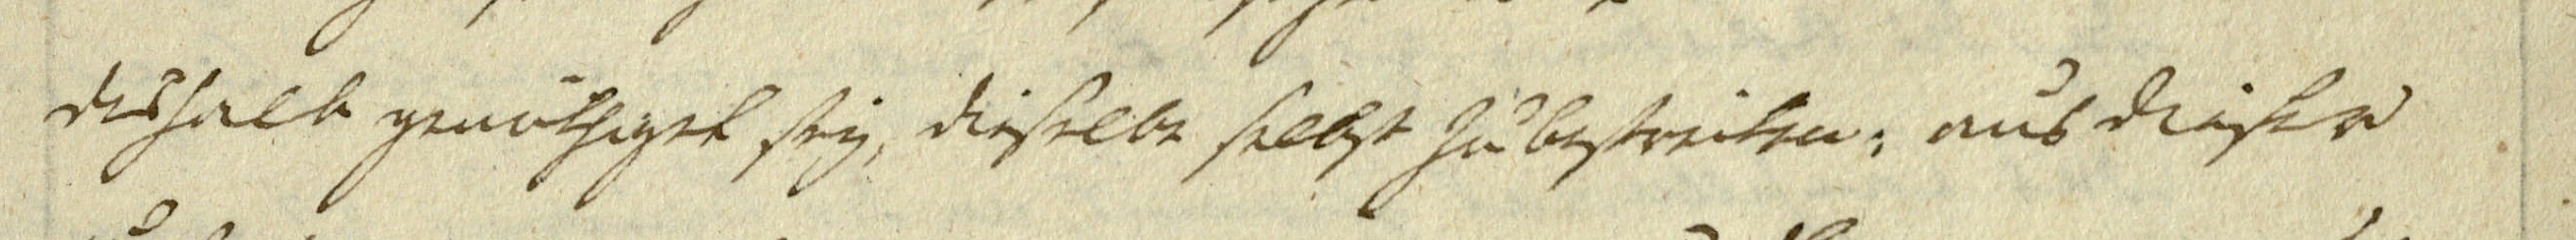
deshalb genöthiget seÿ, dieselbe selbst zu bestreiten; aus dieser
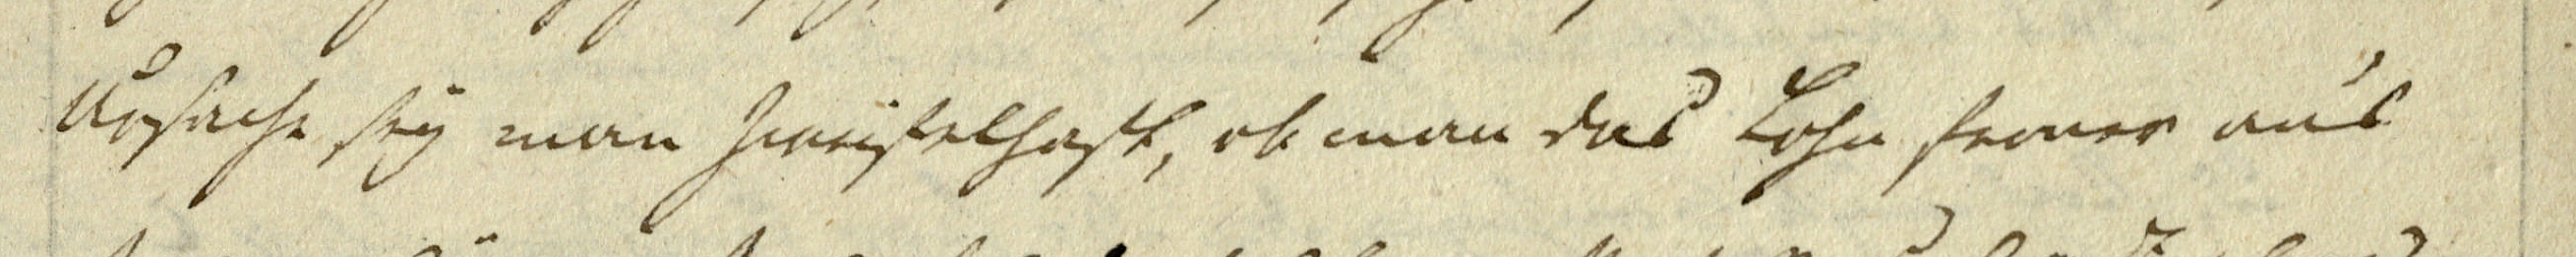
Ursache seÿ man zweifelhaft, ob man das Lohn ferner aus
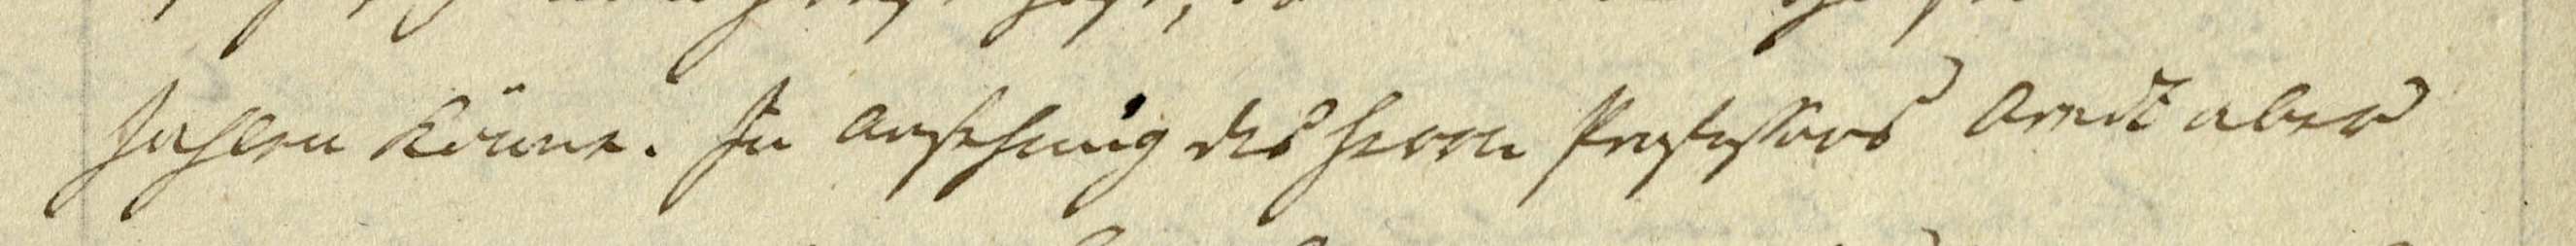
zahlen könne. In Ansehung des Herrn Professors Arndt aber
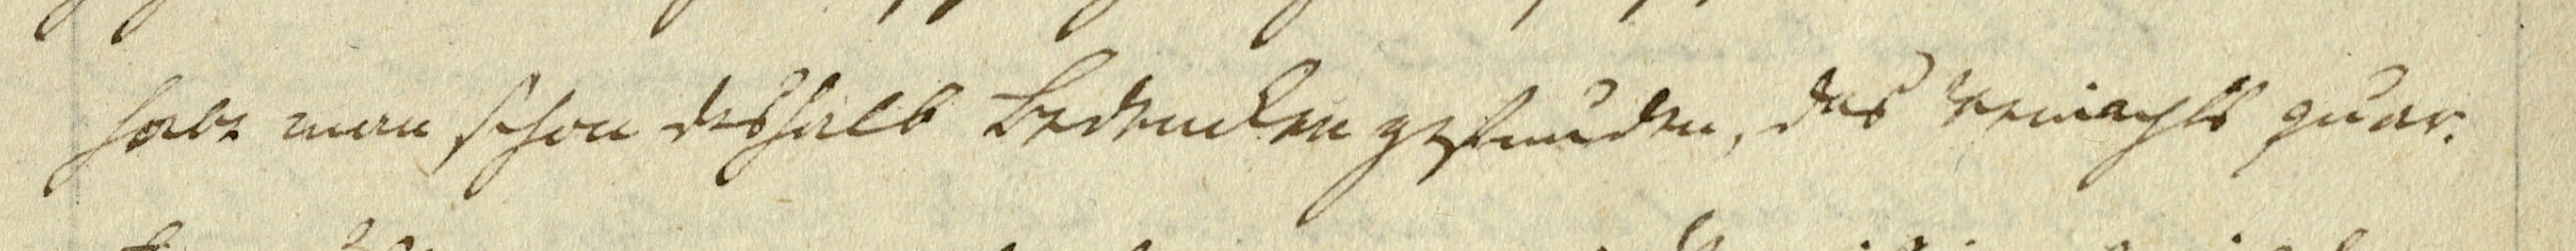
habe man schon deshalb Bedencken gefunden, das Weinachts quar¬
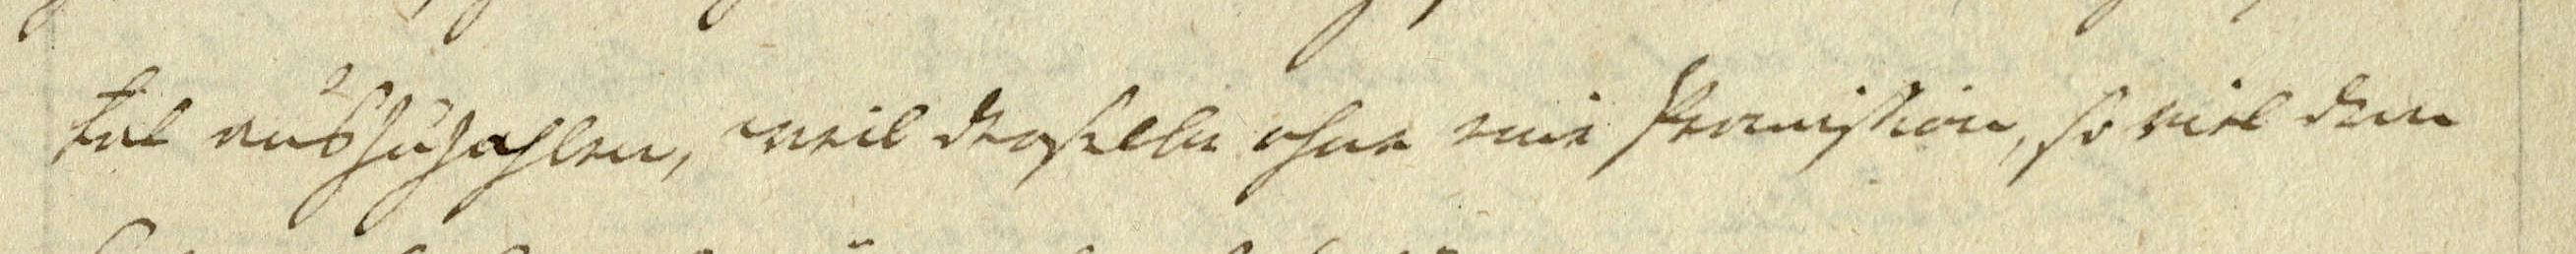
tal auszuzhahlen, weil derselbe ohne eine Permission, so dies dem
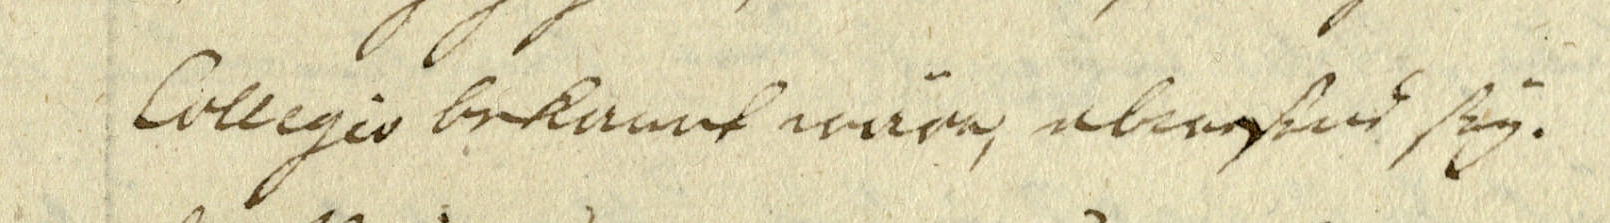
Collegio bekannt wäre, abwesend seÿ.
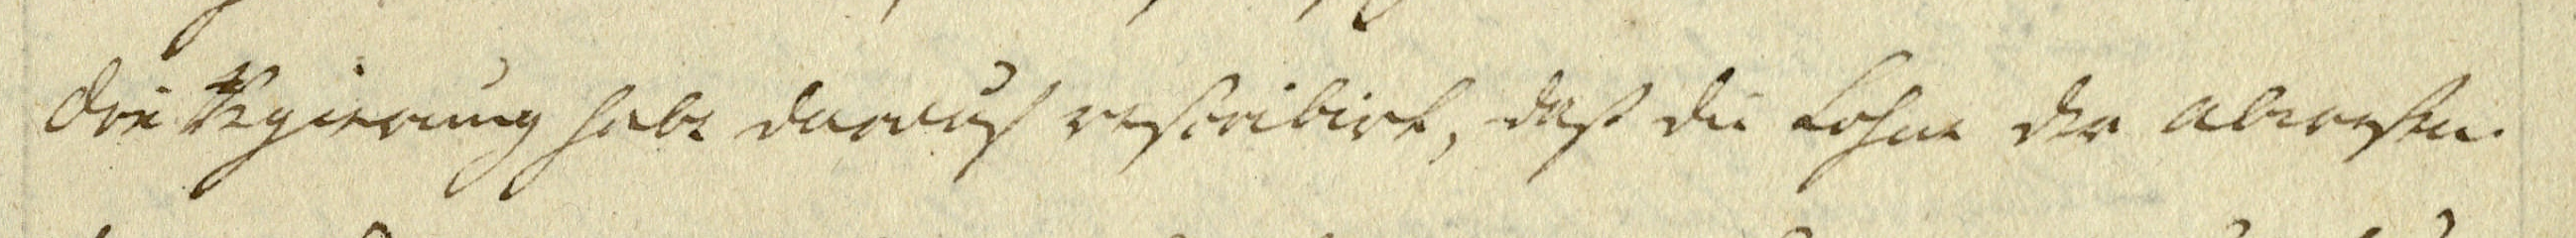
Die Regierung habe darauf rescribirt, daß die Lohne der Abwesen¬
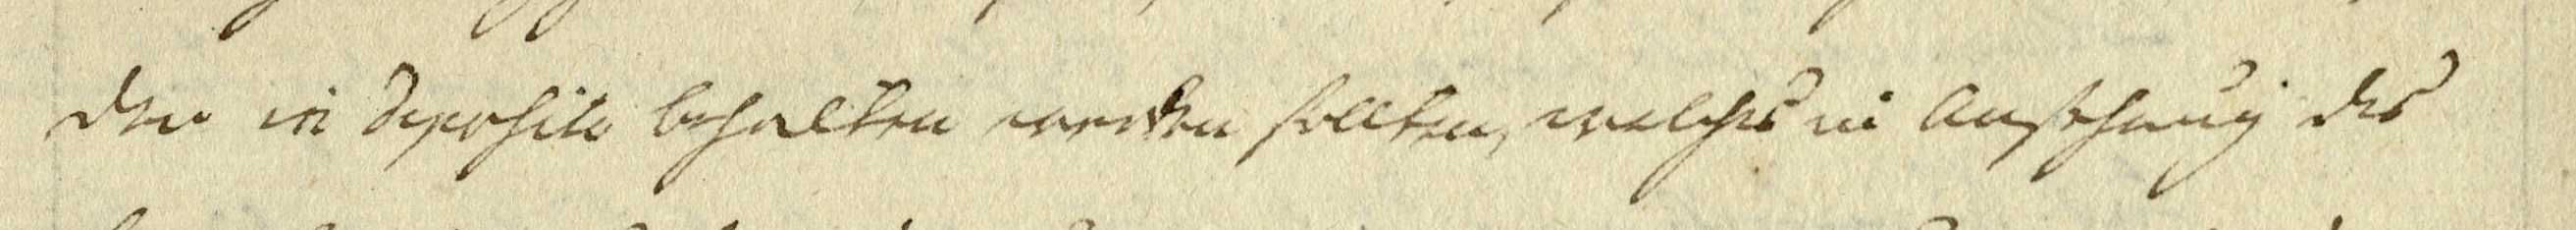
den in deposito behalten werden sollten, welches in Ansehung des
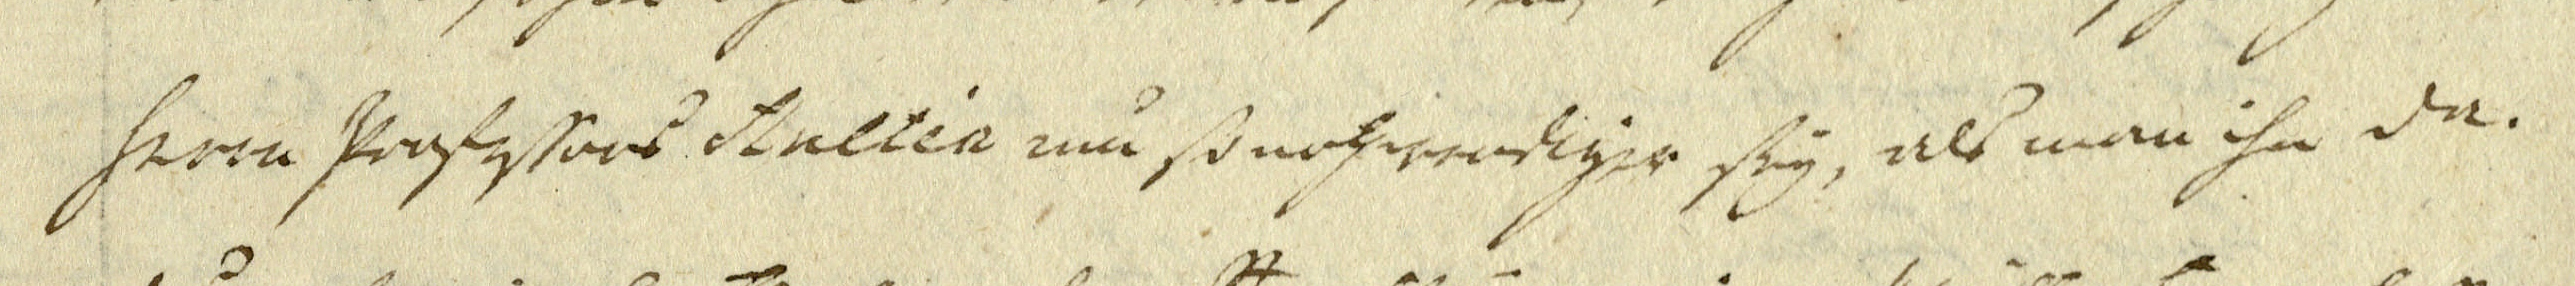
Herrn Professors Hultén um so nothwendiger seÿ, als man ihn da¬
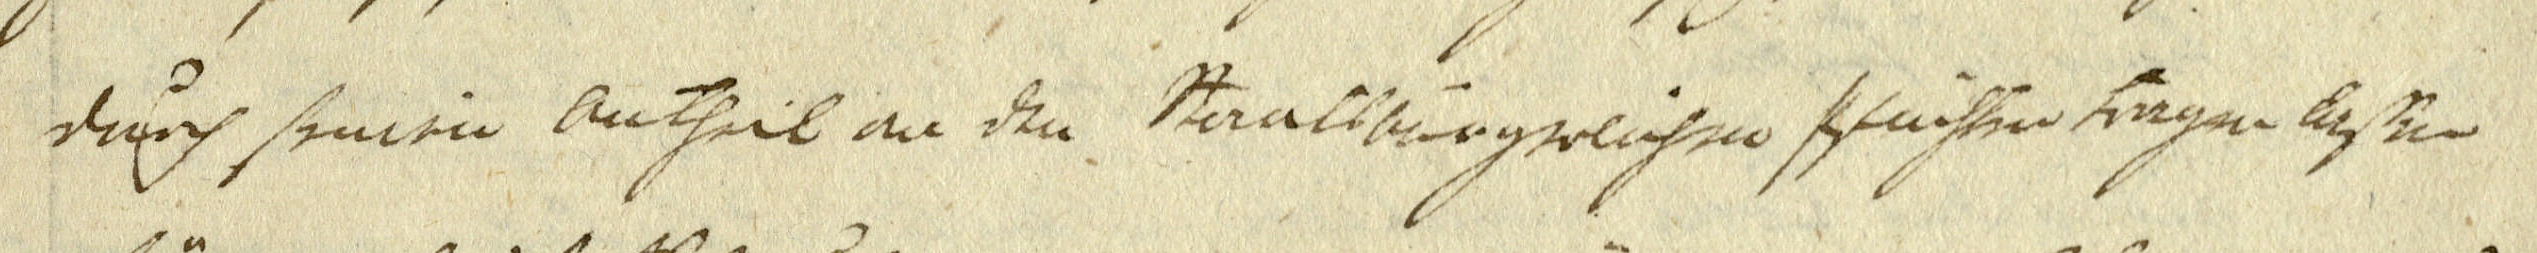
durch seinen Antheil an den Staatsbürgerlichen Pflichten tragen lassen
